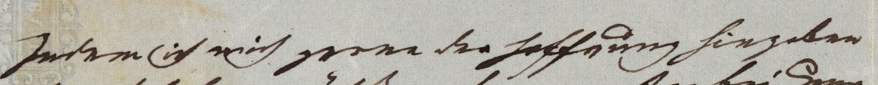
Indem ich mich gerne der Hoffnung hingeben
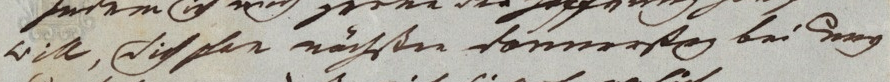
will, Dich schon nächsten Donnerstag bei uns
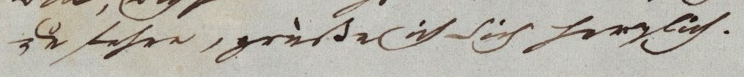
zu sehen, grüße ich Dich herzlich
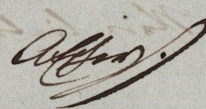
A Escher.
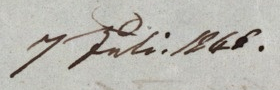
7 Juli. 1846.
